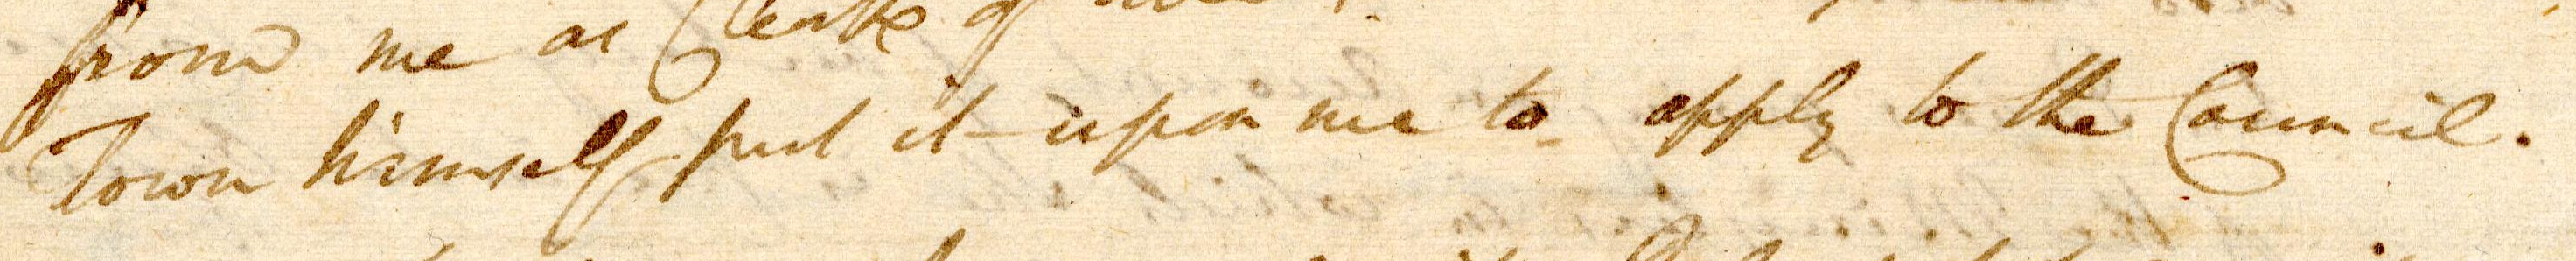Town himself put it upon me to apply to the Council.
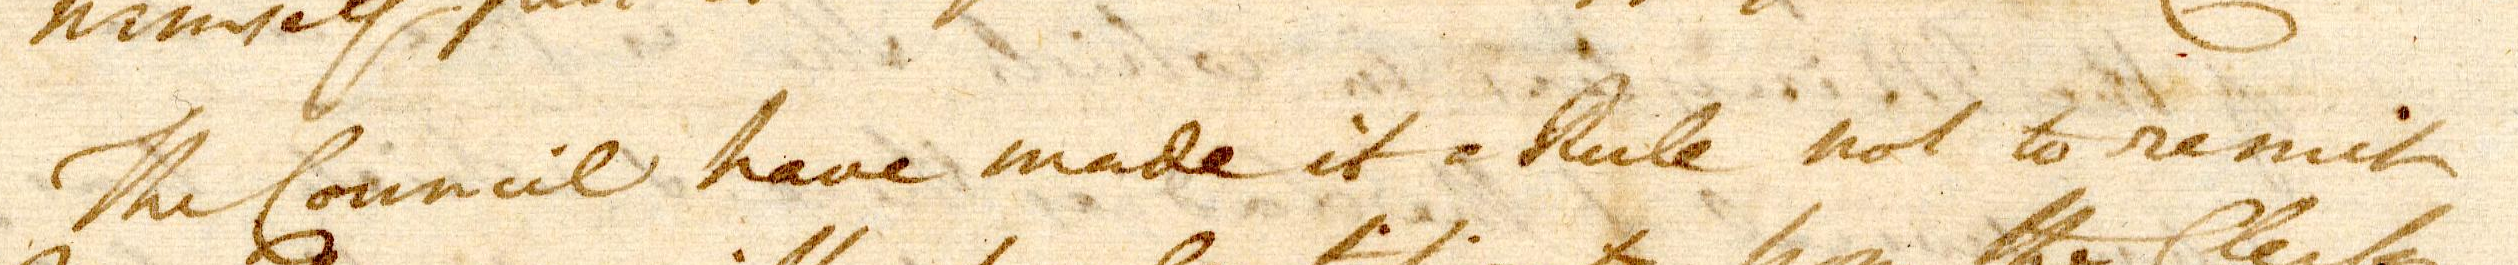The Council have made it a Rule not to remit
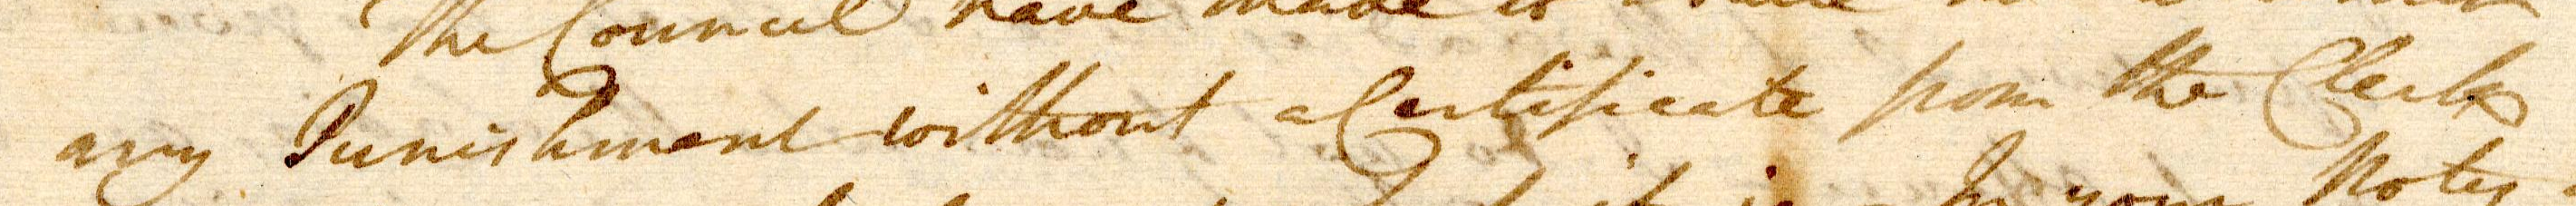any Punishment without a Certificate fom the Clerk
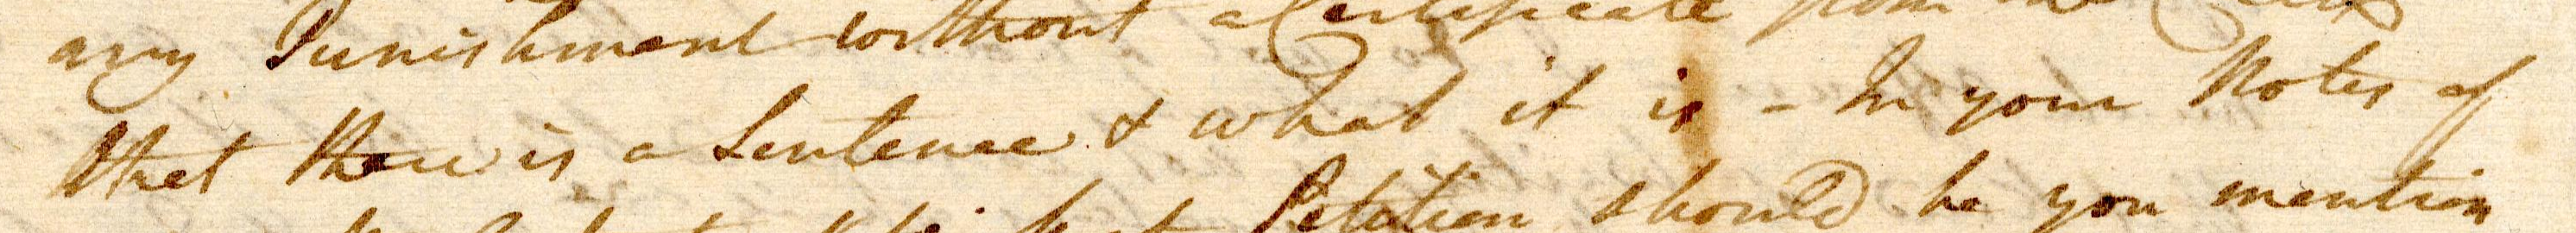that there is a Sentence & what it is. In your Notes of
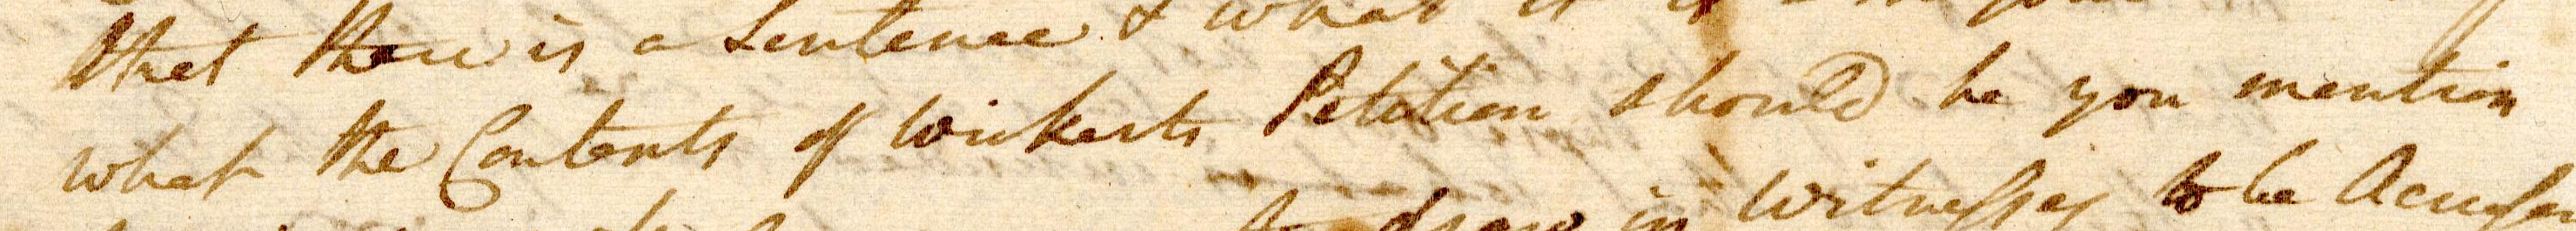what the Contents of Wickerts Petition should he you mention
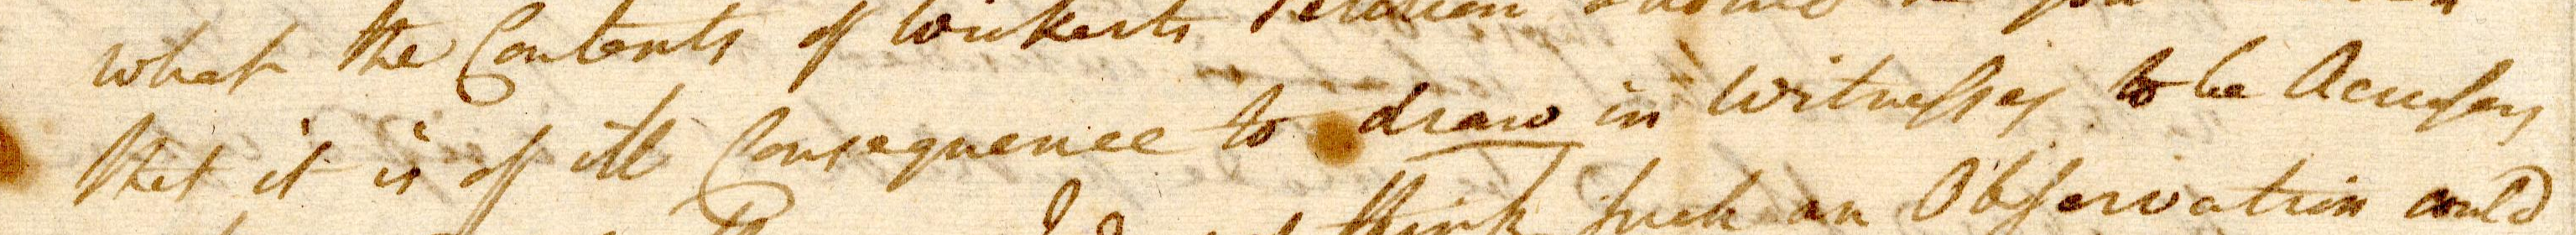that it is of ill Consequence to draw in Witnesses to be Acusers
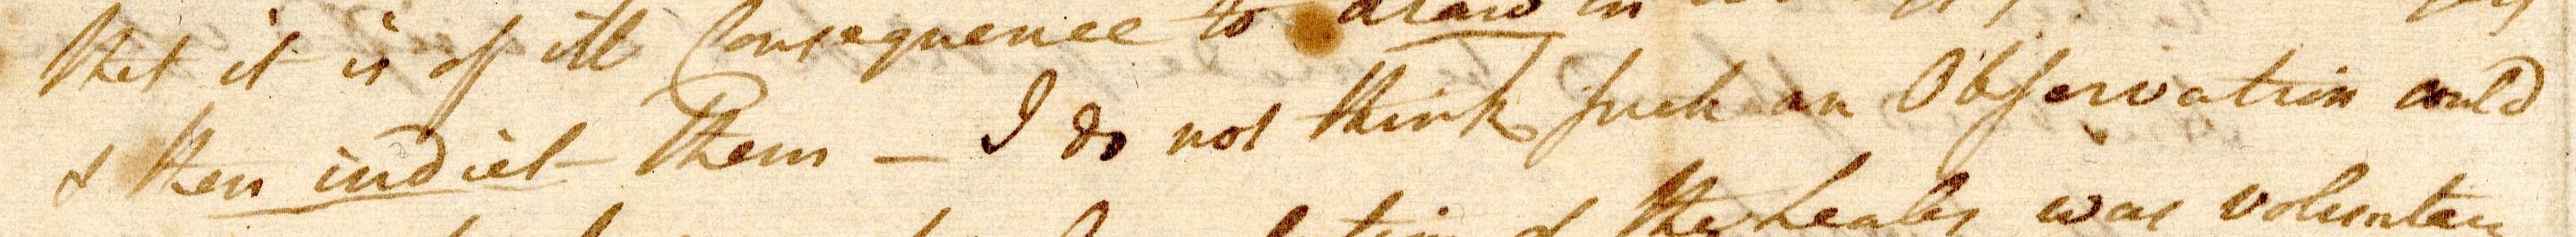& then indict them. I do not think such an Observation could
